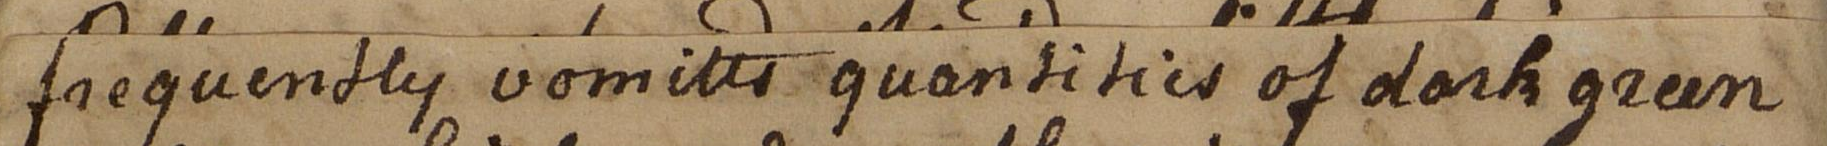frequently vomitts quantities of dark green
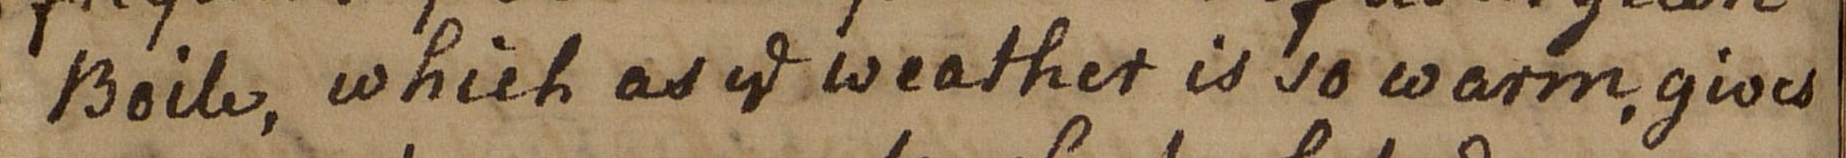Boile, which as y^e weather is so warm, gives
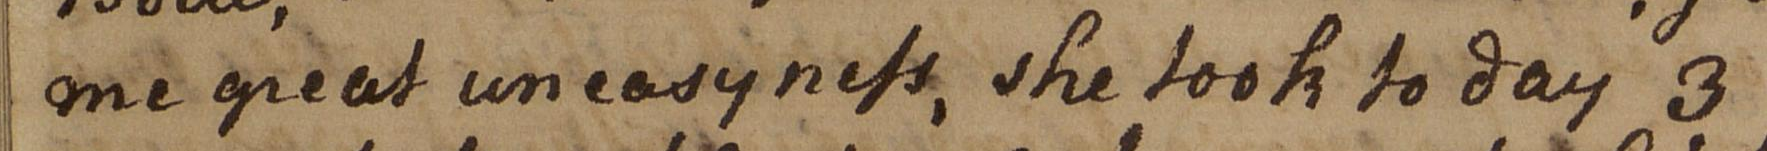me great uneasyness, she took to day 3
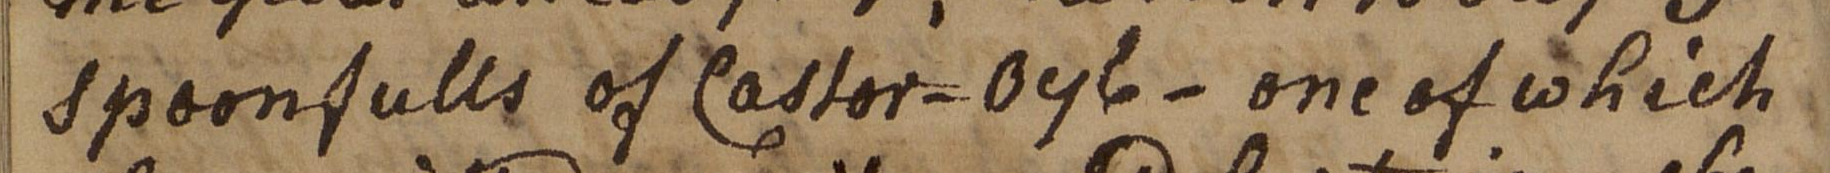spoonfulls of Castor-oyl- one of which
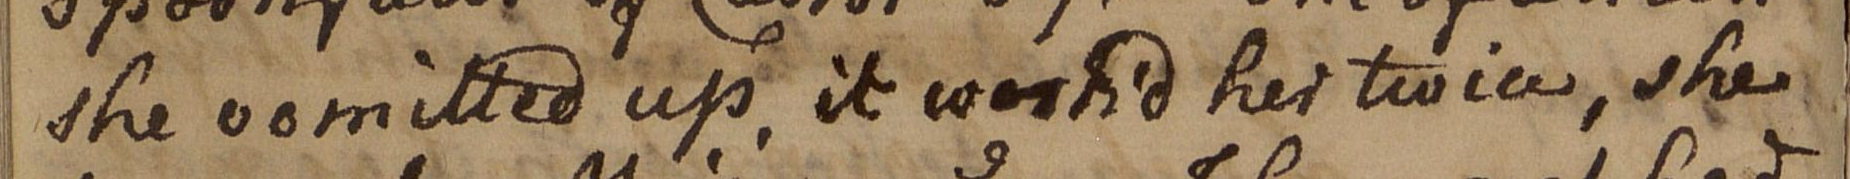she vomitted up, it work'd her twice, she
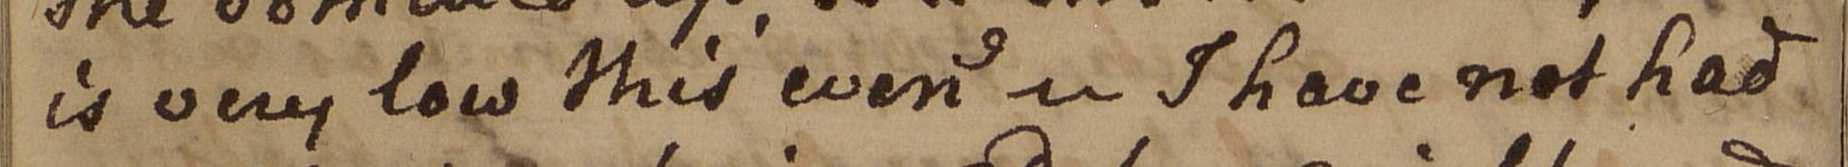is very low this even^g- I have not had
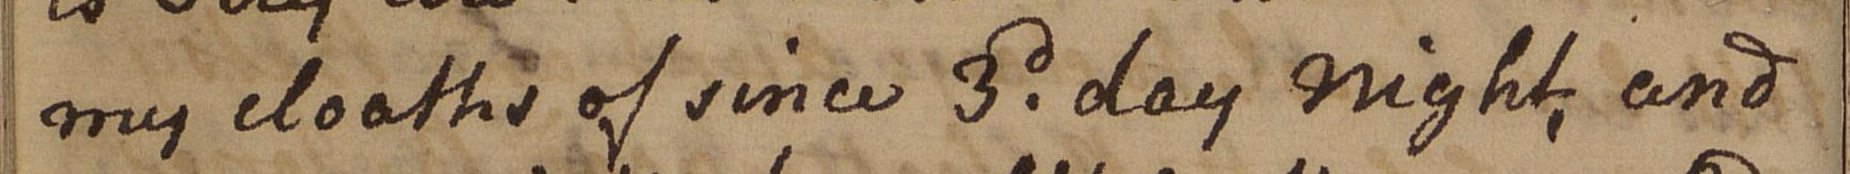my cloaths of since 3^d. day night, and
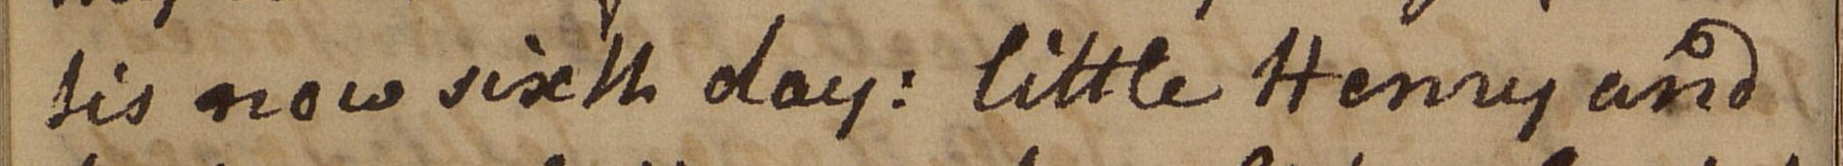tis now sixth day: little Henry and
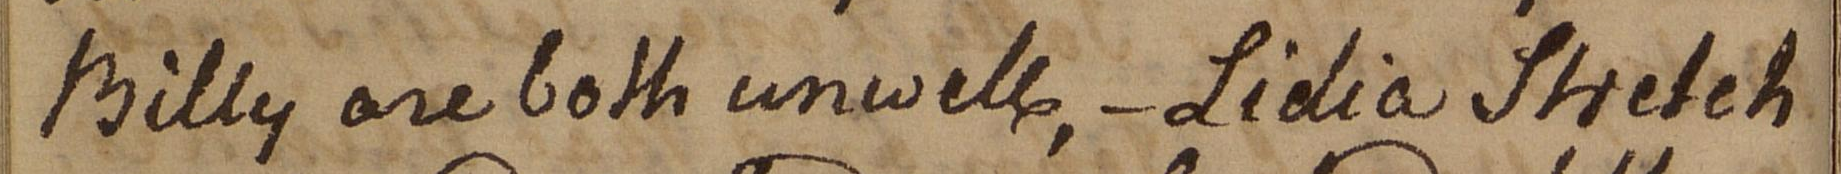Billy are both unwell,- Lidia Stretch
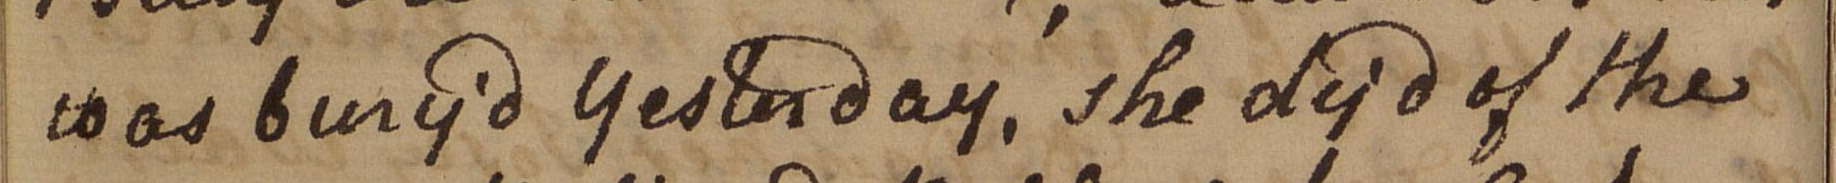was bury'd yesterday, she dy'd of the
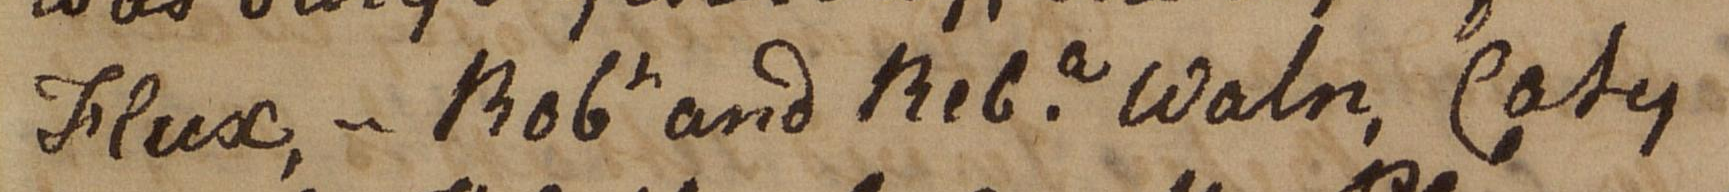Flux, Rob^t and Reb^a. Waln, Caty
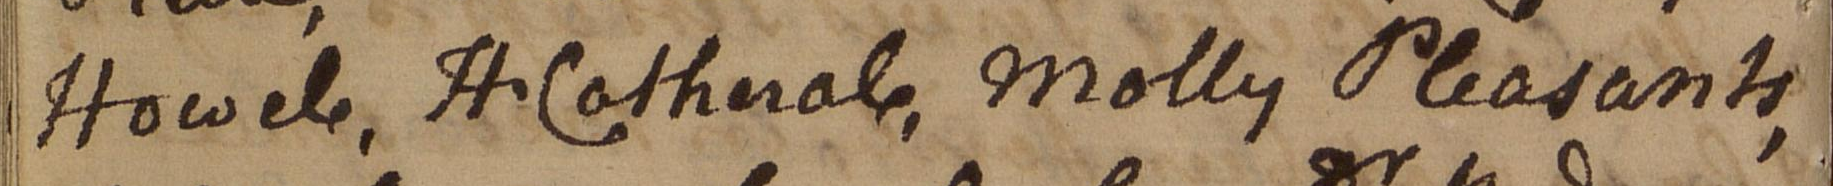Howel, H Catheral, Molly Pleasants,
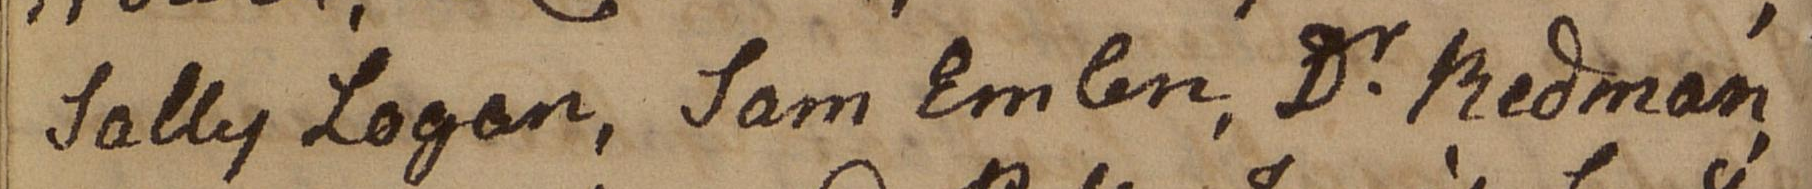Sally Logan, Sam Emlen, D^r. Redman
